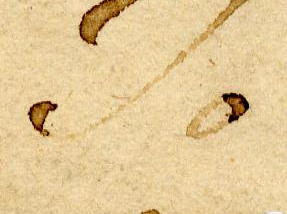To
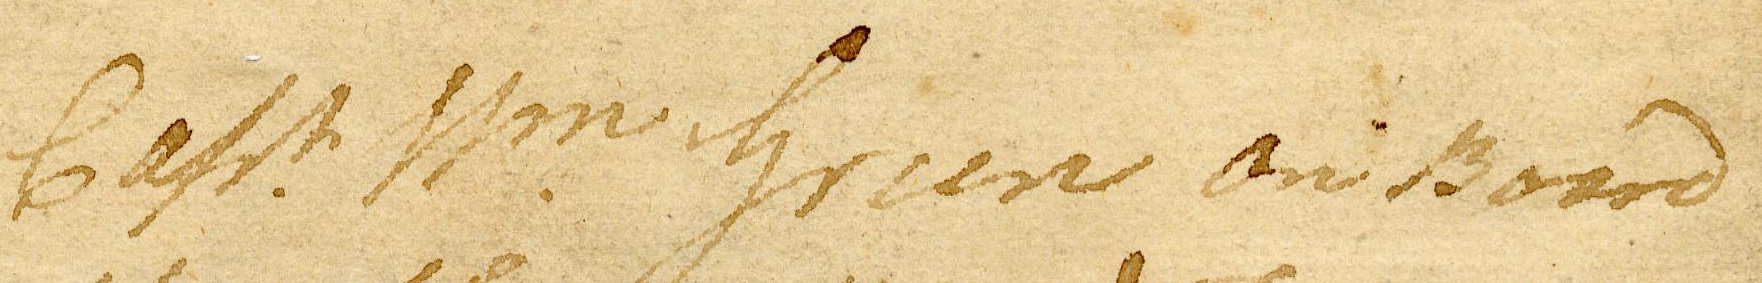Cap^t W^m Green on Board
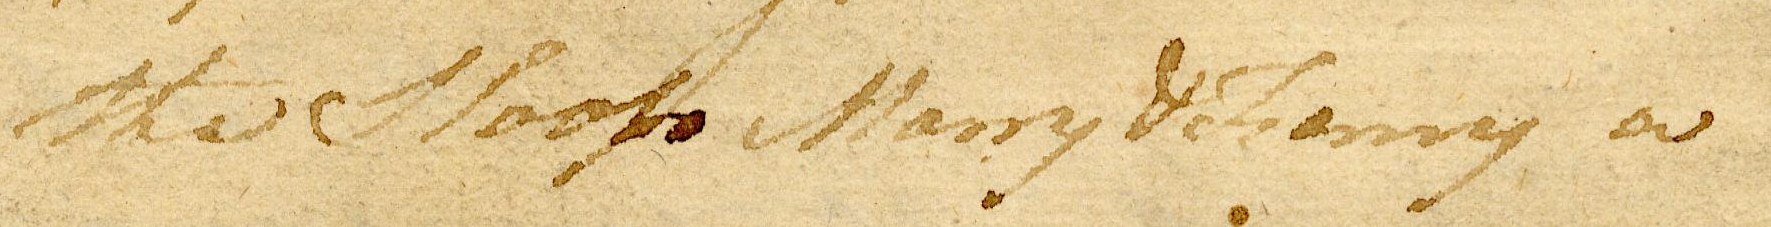The sloop Mary & Fanny a
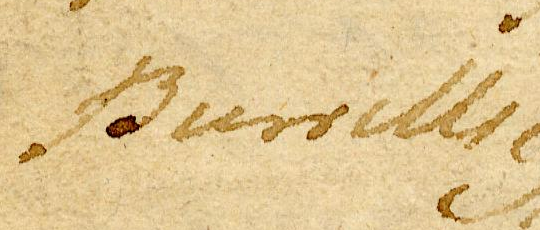Burrills
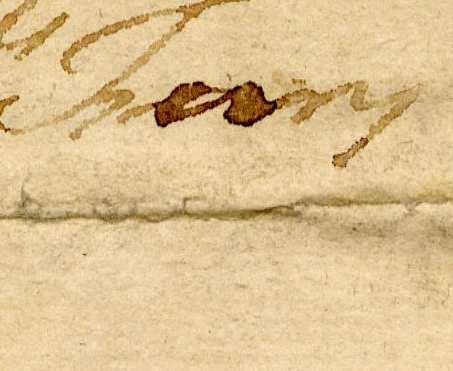Ferry
